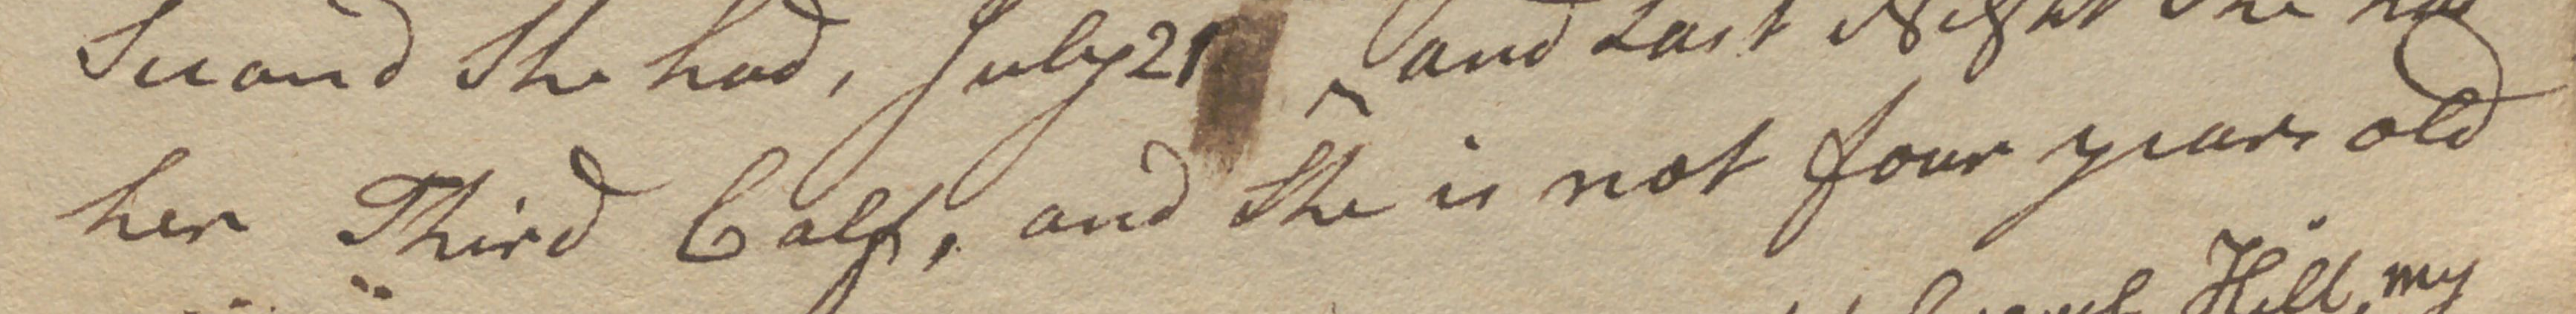her Third Calf, and she is not four years old
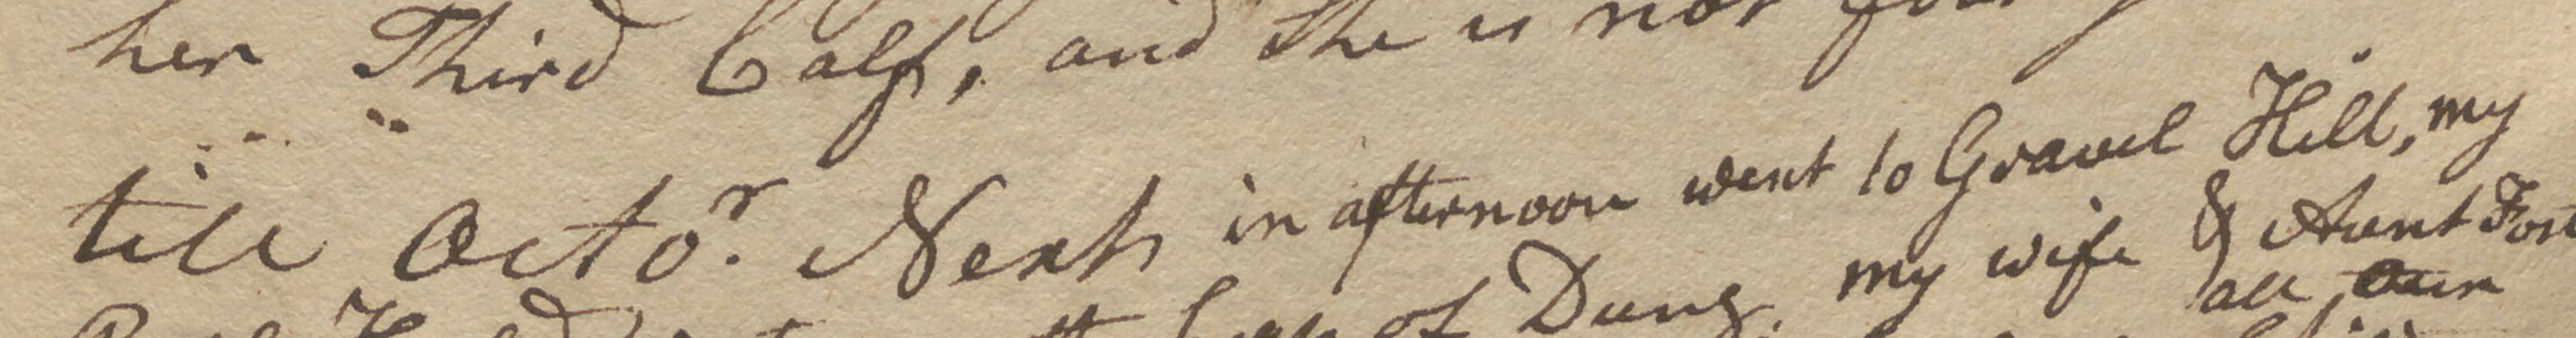till Octo^r. Next in afternoon went to Gravel Hill, my
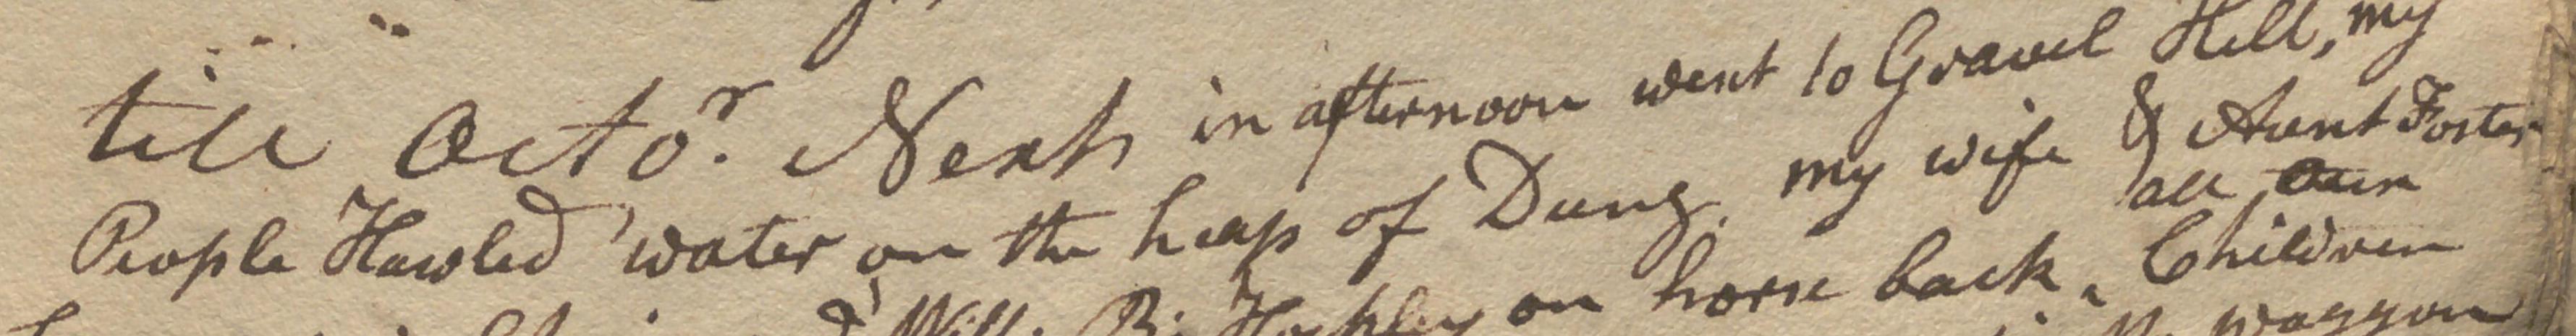People Hawled water on the heaps of Dung my wife & Aunt Foster
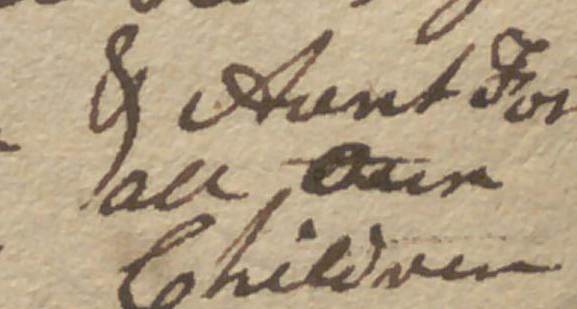ace own
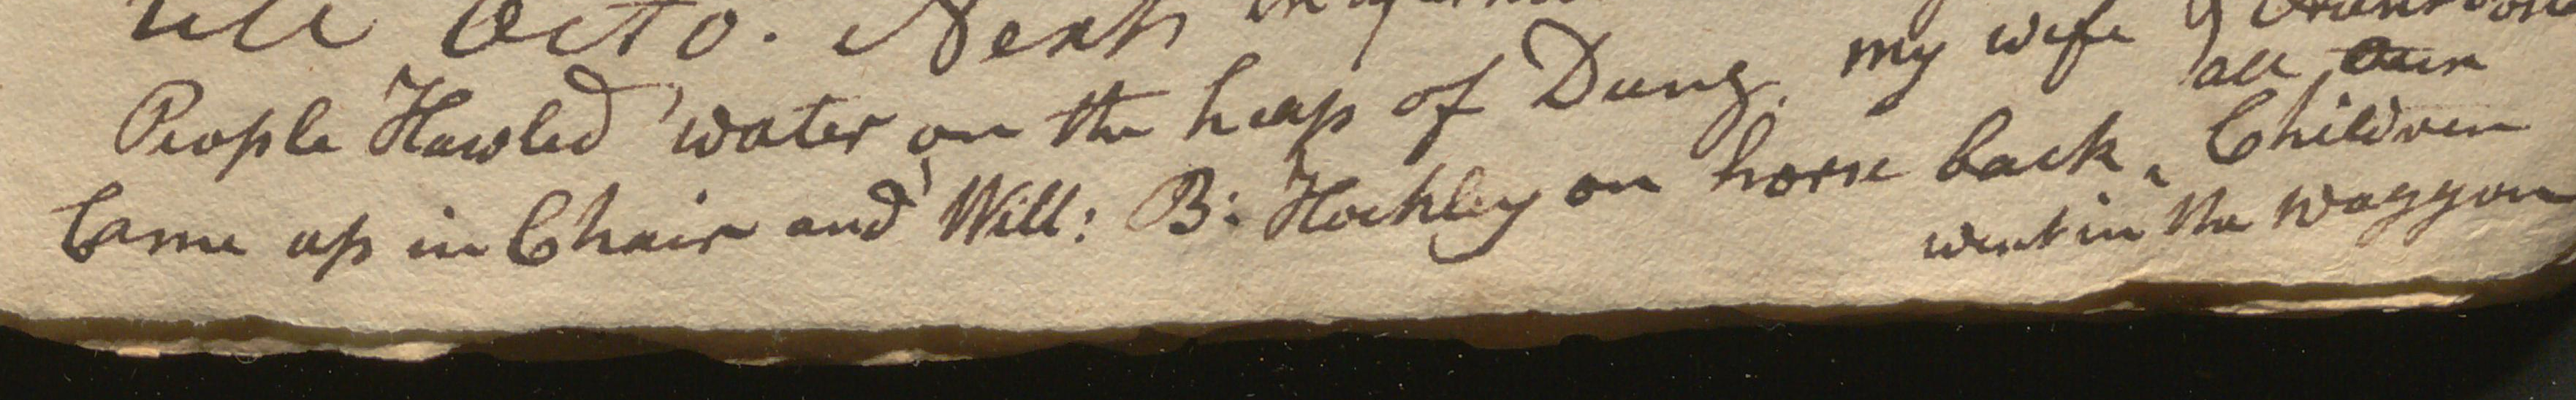Come up in Chair and Will: B: Hockley on horse back, Children
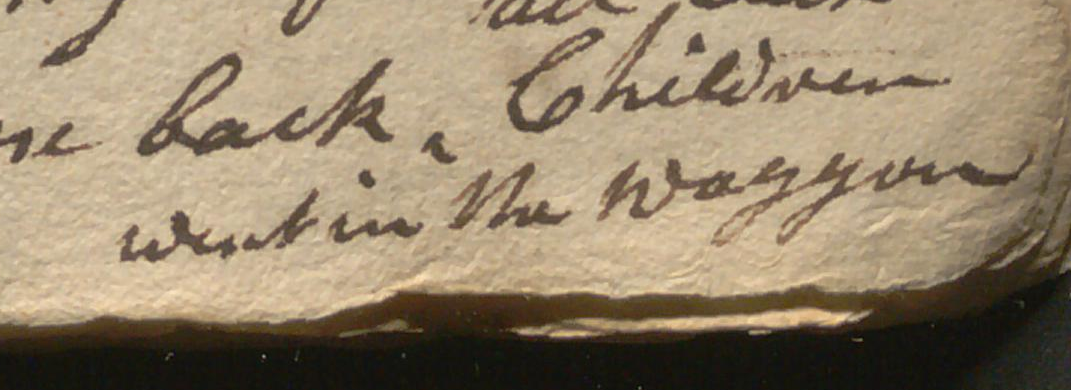went in the waggon
